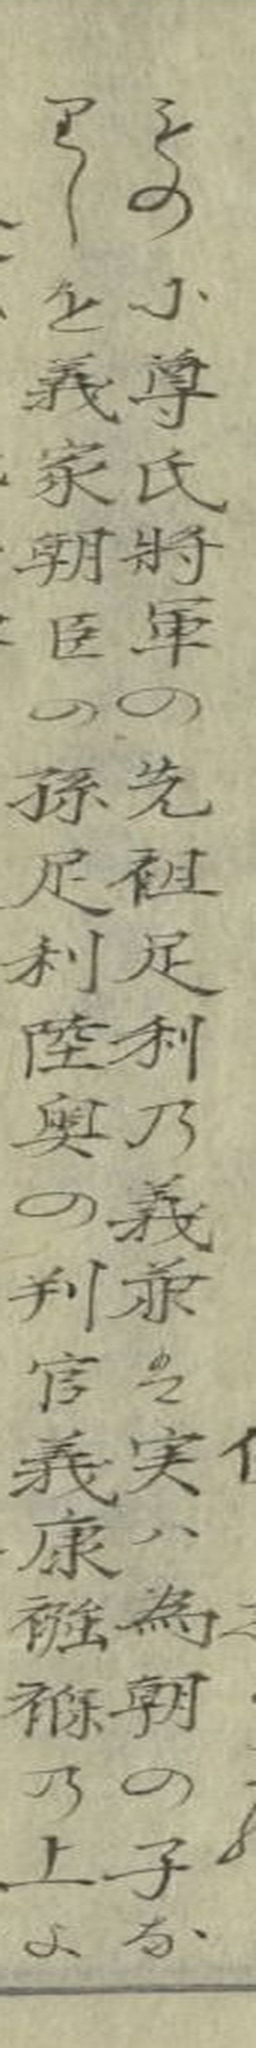りしを義家朝臣の孫足利陸奥の判官義康襁褓の上よ
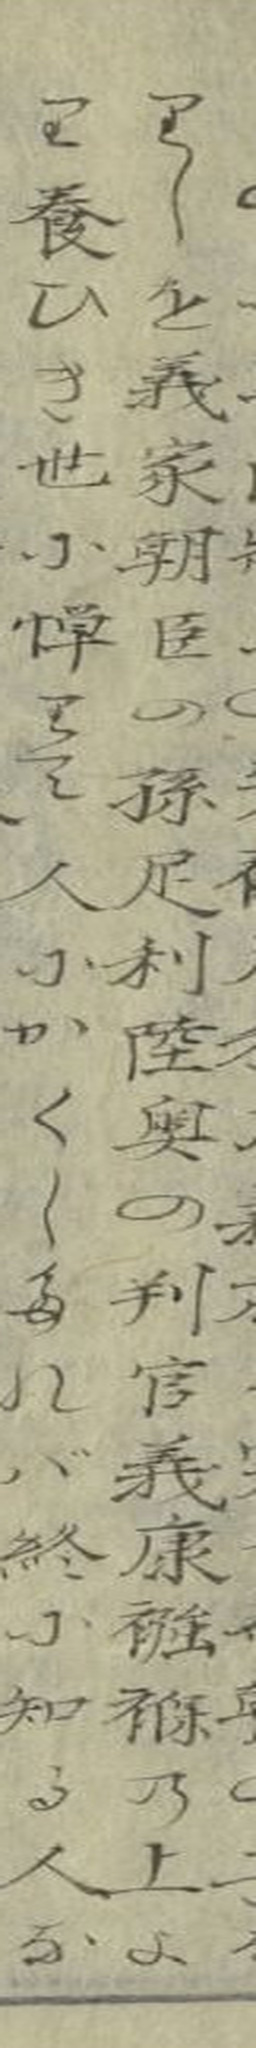り養ひき世に憚りて人にかくしたれば終に知る人な
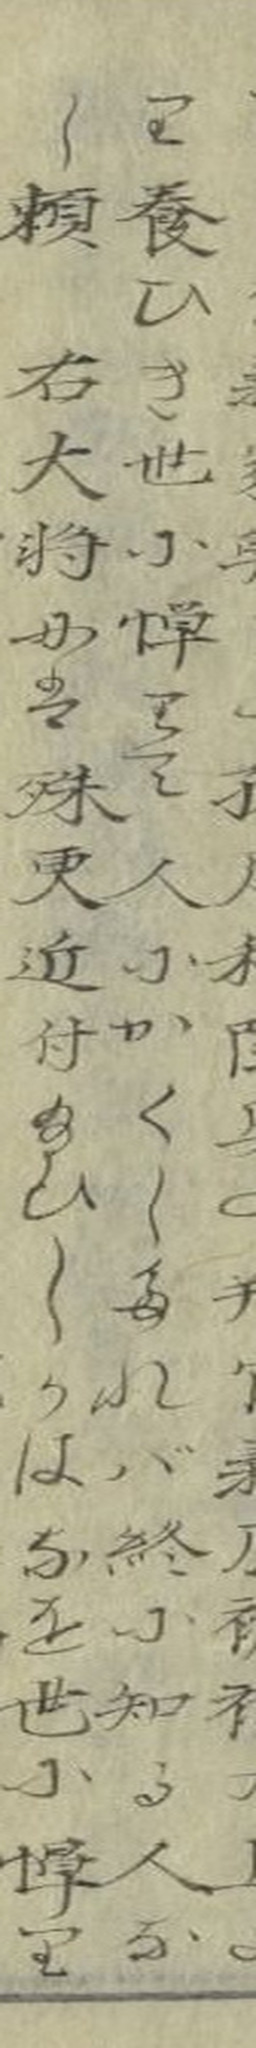し頼右大将には殊更近付給ひしかはなを世に憚り
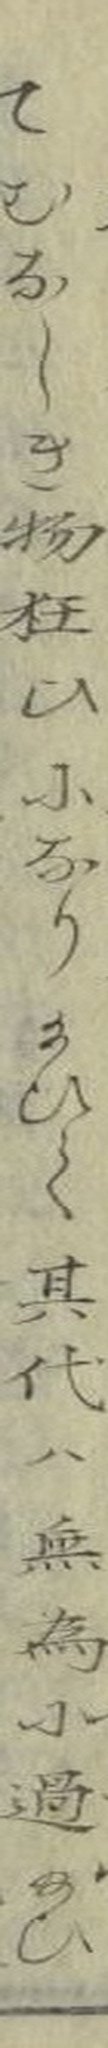てむなしき物狂ひになり給ひて其代は無為に過給ひ
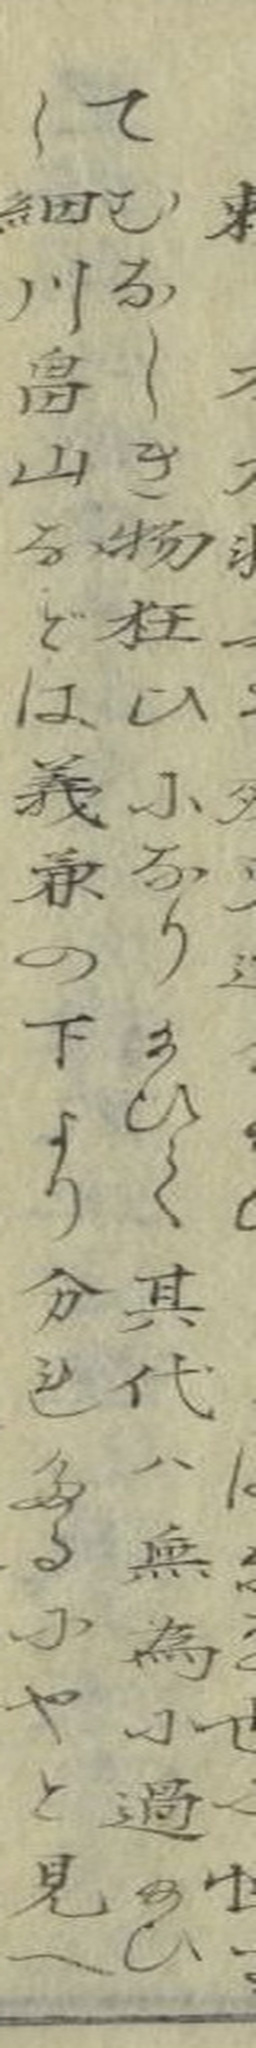し細川畠山などは義兼の下より分れたるにやと見へ
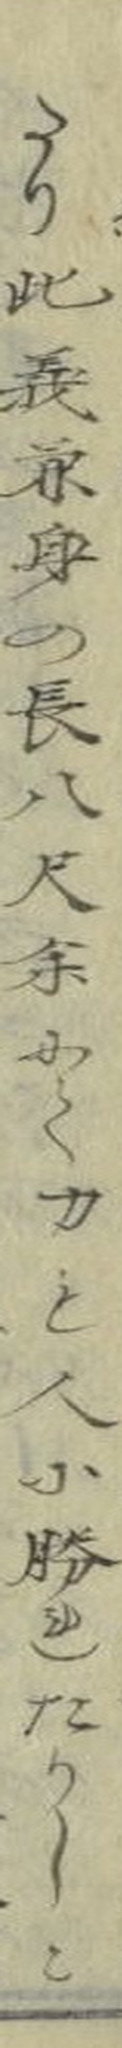たり此義兼身の長八尺余にて力も人に勝れたりしと
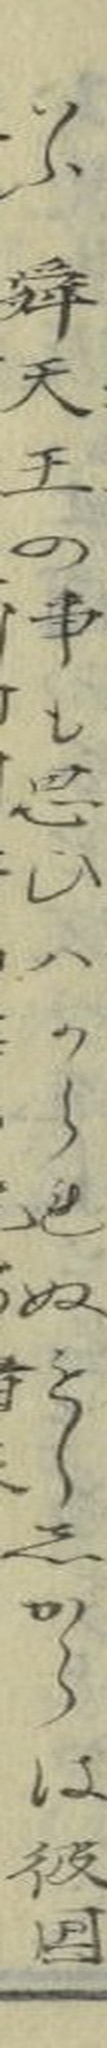いふ舜天王の事も思ひはかられぬもししからは後国
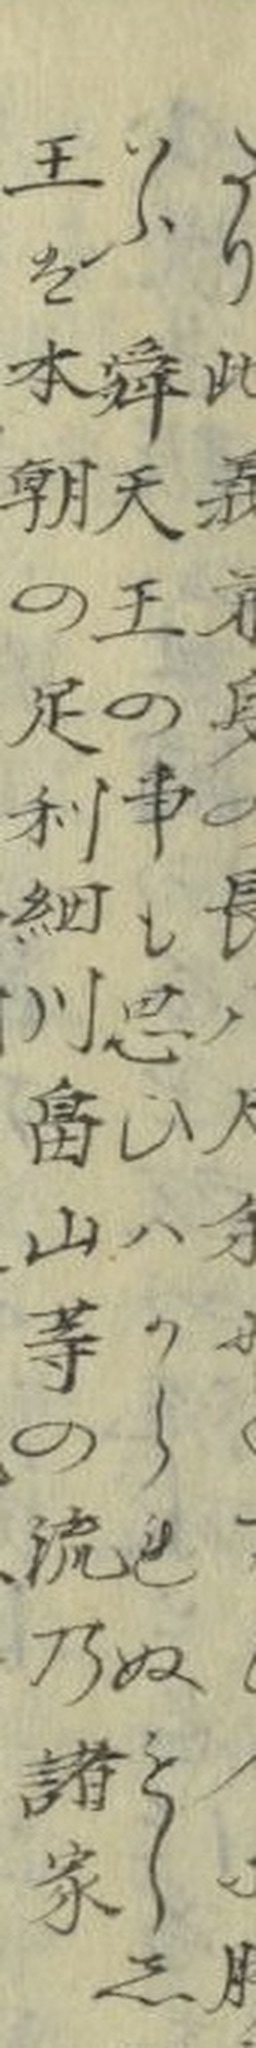王は本朝の足利細川畠山等の流の諸家
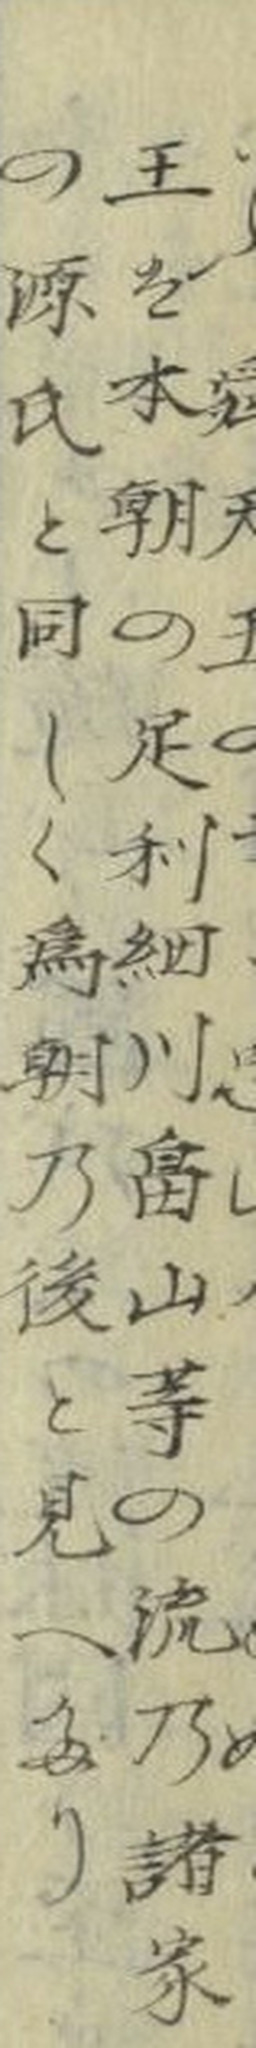の源氏と同しく為朝の後と見へたり
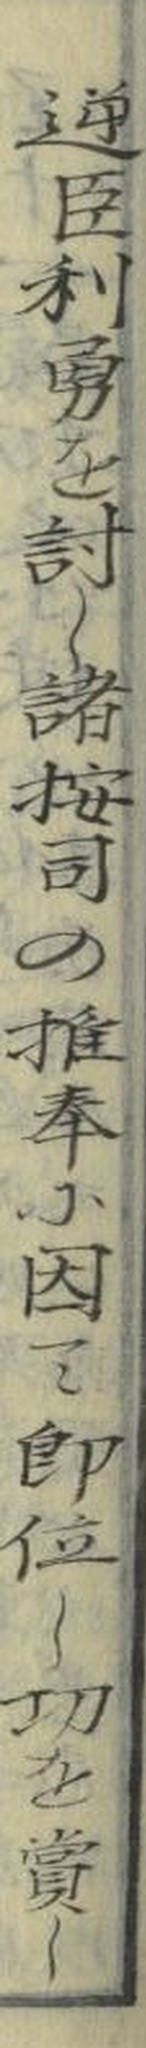逆臣利勇を討し諸按司の推奉に因て即位し功を賞し
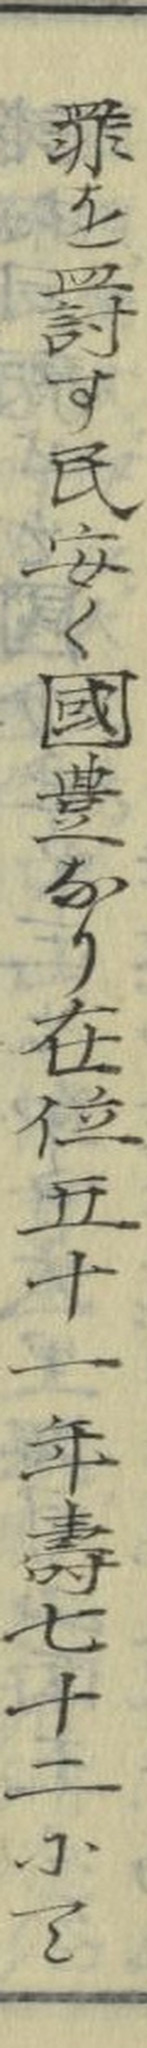罪を罰す民安く国豊なり在位五十一年寿七十二にて
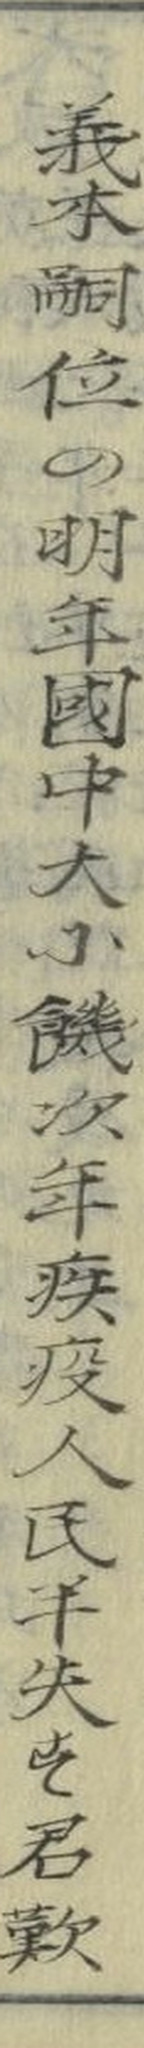義本嗣位の明年国中大に餓次年疾疫人民半失す君歎
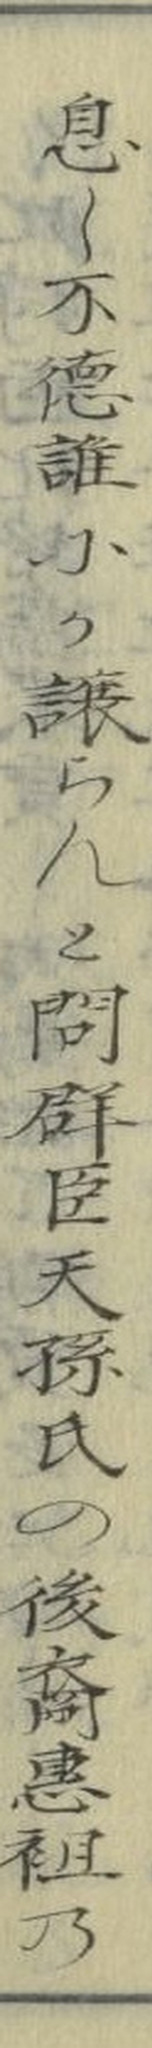息し不徳誰にか譲らんと問群臣天孫氏の後裔恵祖の
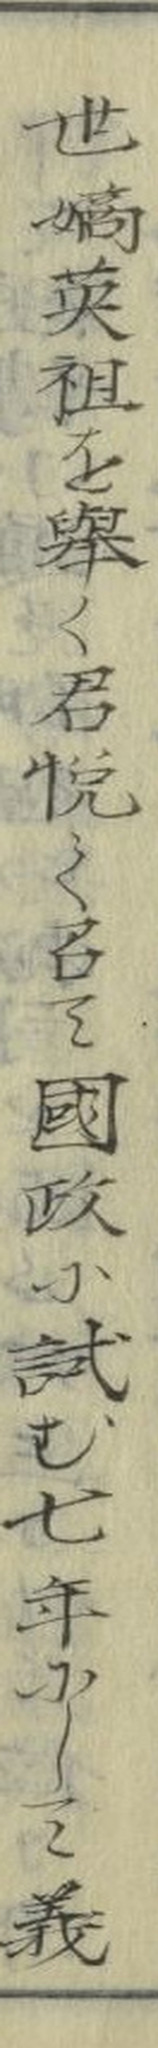世嫡英祖を挙く君悦て召て国政に試む七年にして義
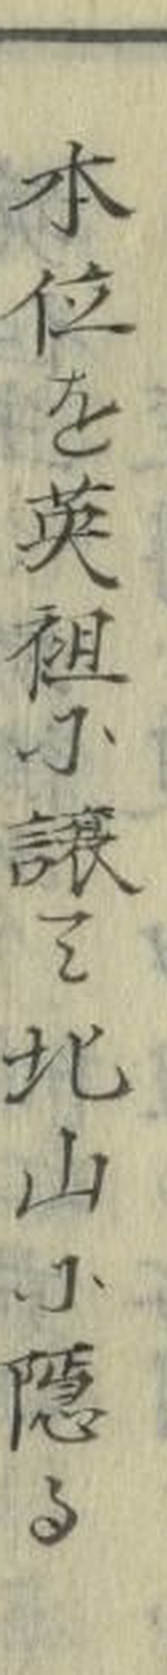本位を英祖に譲て北山に隠る
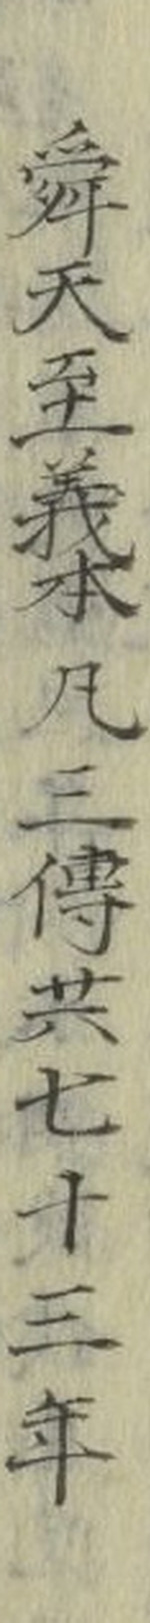舜天至義本凡三伝共七十三年
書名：琉球沿革志 下
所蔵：University of the Ryukyus Library
